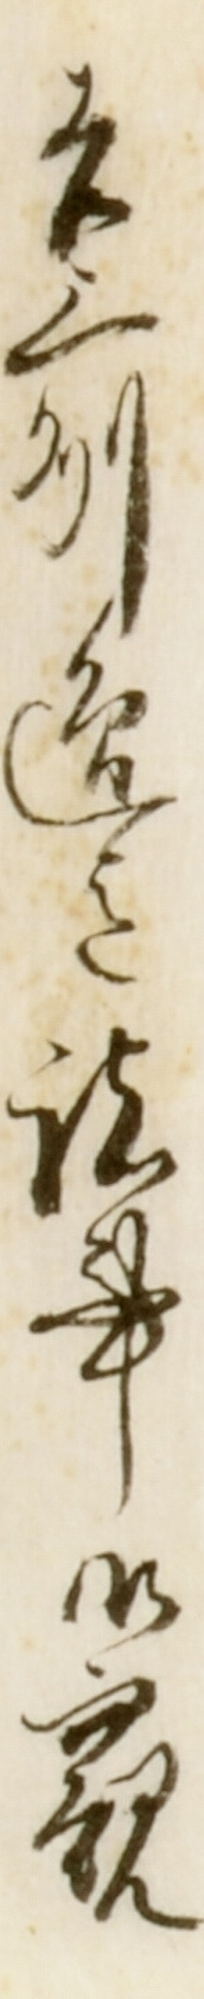吉三州辺迄諸事御窺
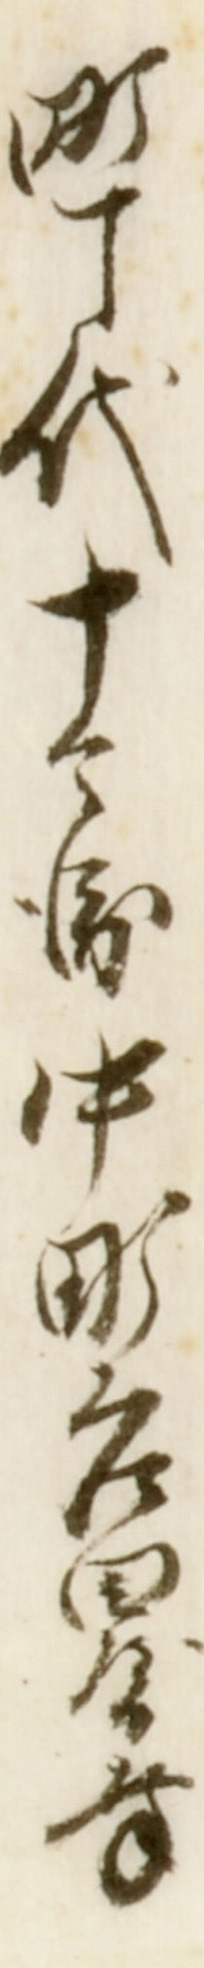町丁代十兵衛中町庄田屋幸
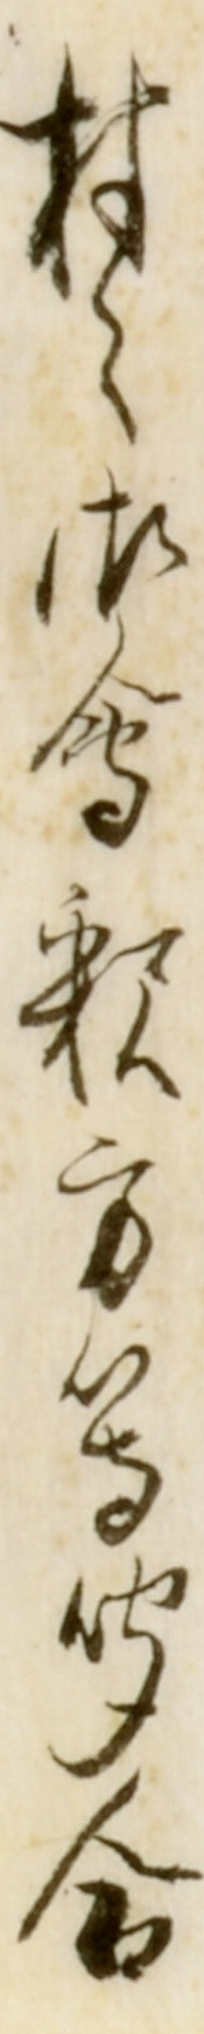村々御会釈方等聞合

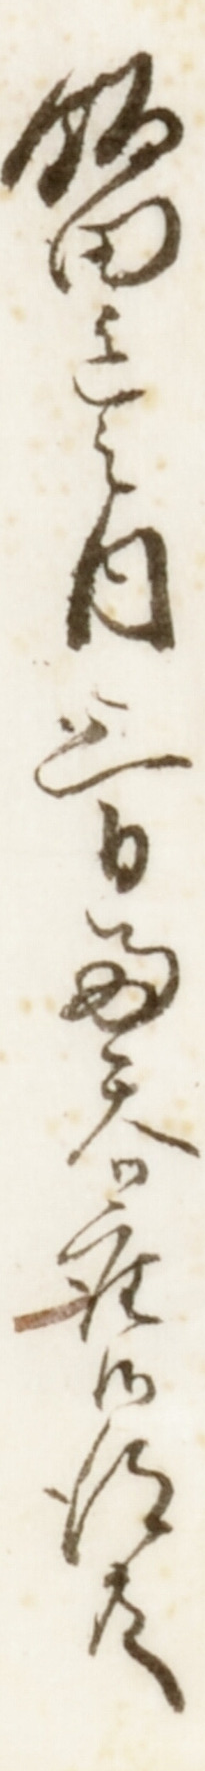飯田迄之内三日雨天御座候得共
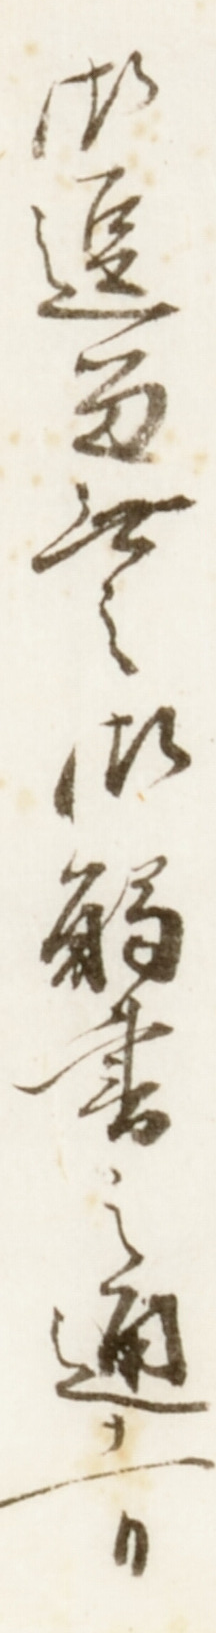御逗留無之御触書之通十一日
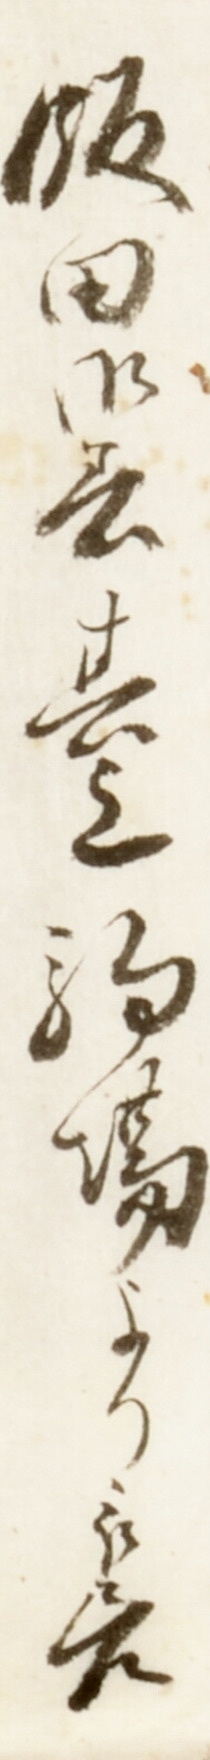飯田御着其上駒場より被差
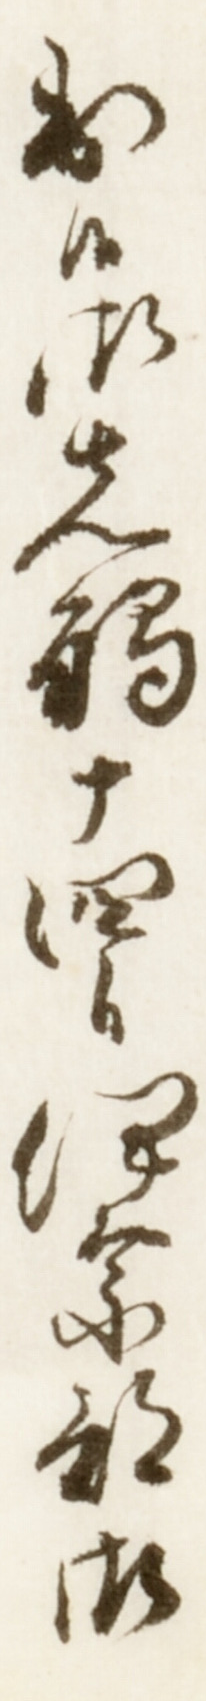出候御先触十四日伊那郡御
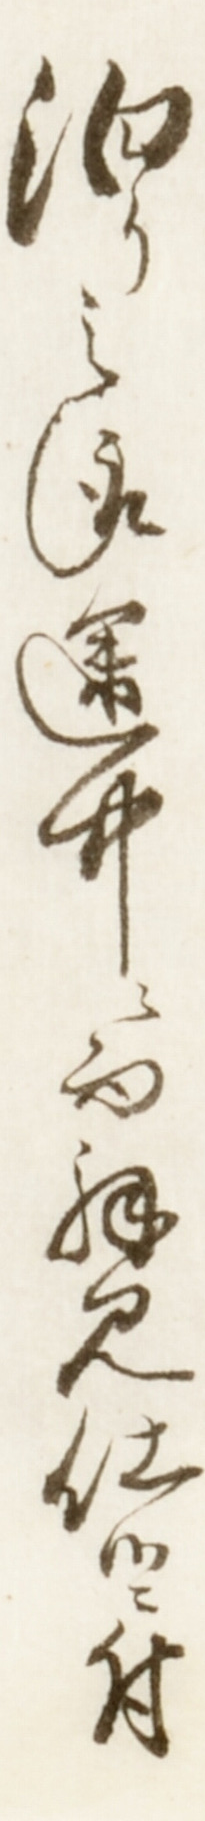泊り之趣途中ニ而拝見仕候ニ付
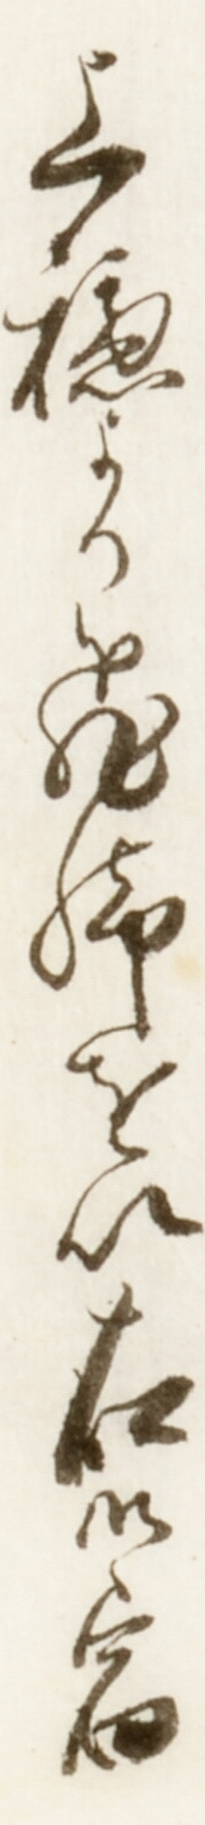上穂より飛脚を以右御宿
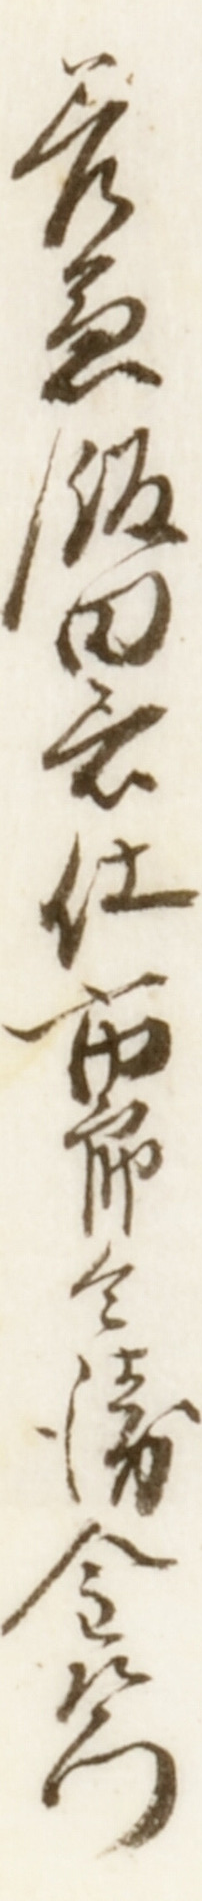差急飯田着仕市郎兵衛金左衛門
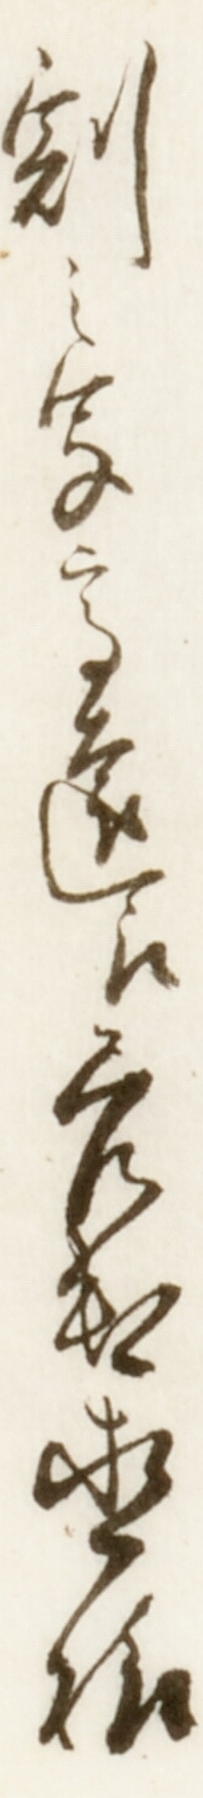割之写高遠江差出直様
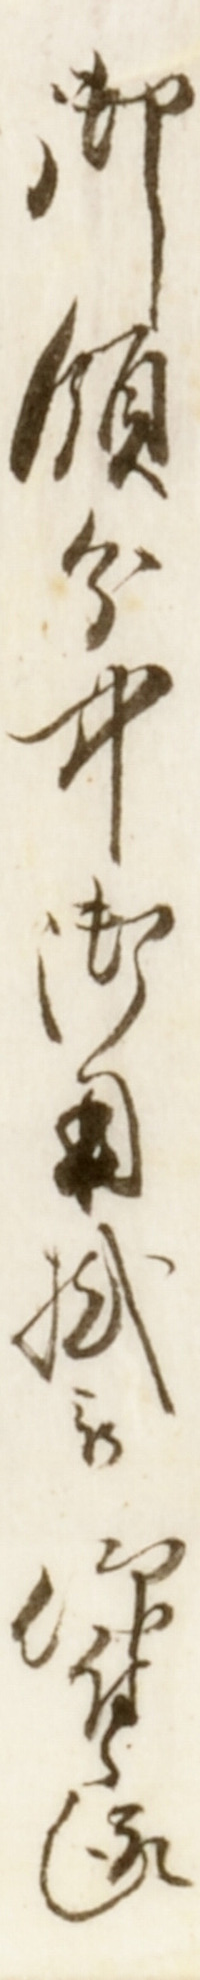御領分中御用掛被仰付候趣
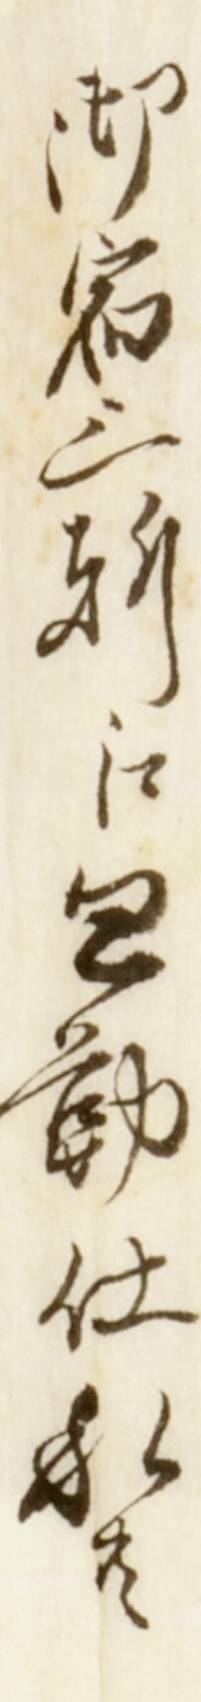御宿三軒江廻勤仕私共
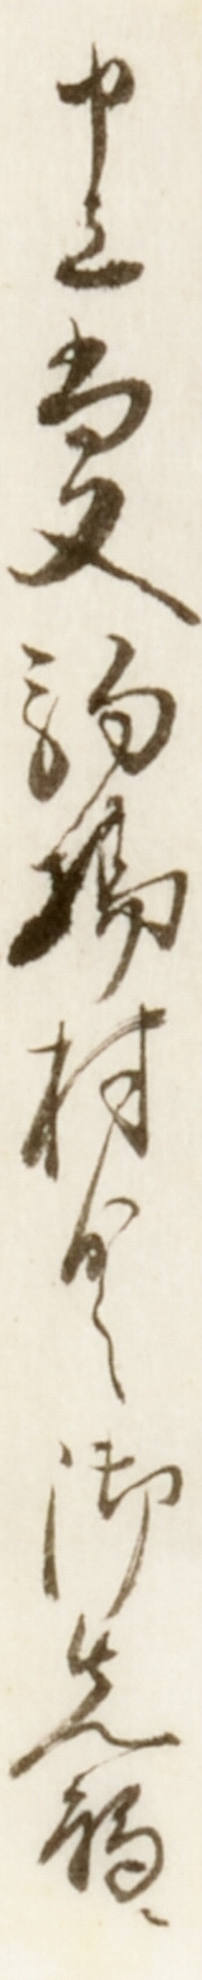申上尚又駒場村ゟ之御先触ニ
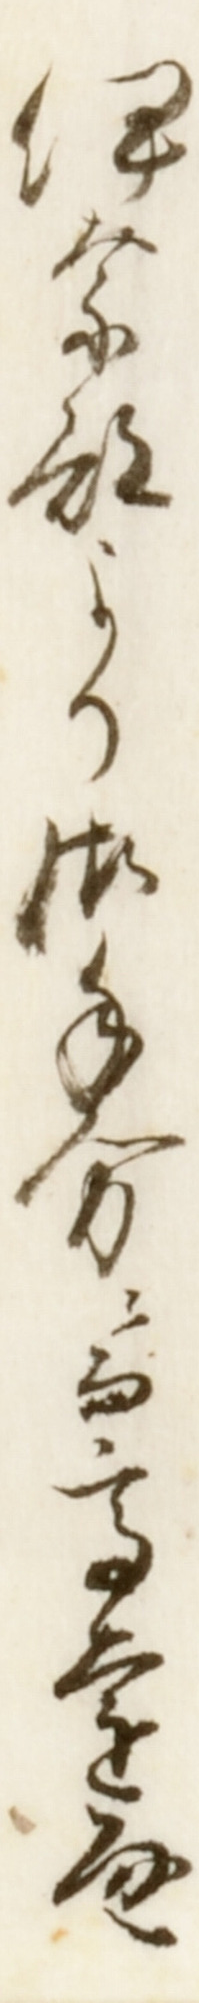伊那郡より御手分ニ而高遠通
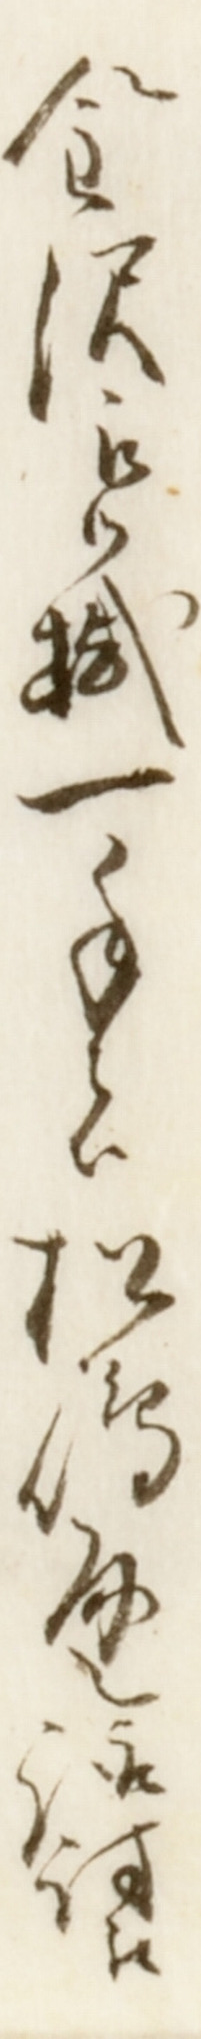金沢江御掛一手者松嶋通諏訪江
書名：諸事書上
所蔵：伊那市立高遠町図書館・合同会社AMANE
